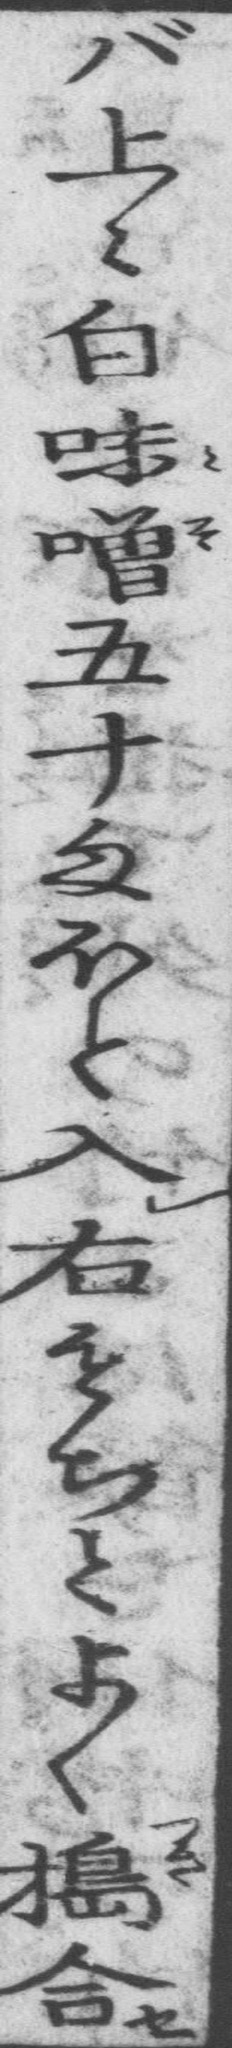ば上々白味噌五十匁ほと入れ右もちとよく搗合せ
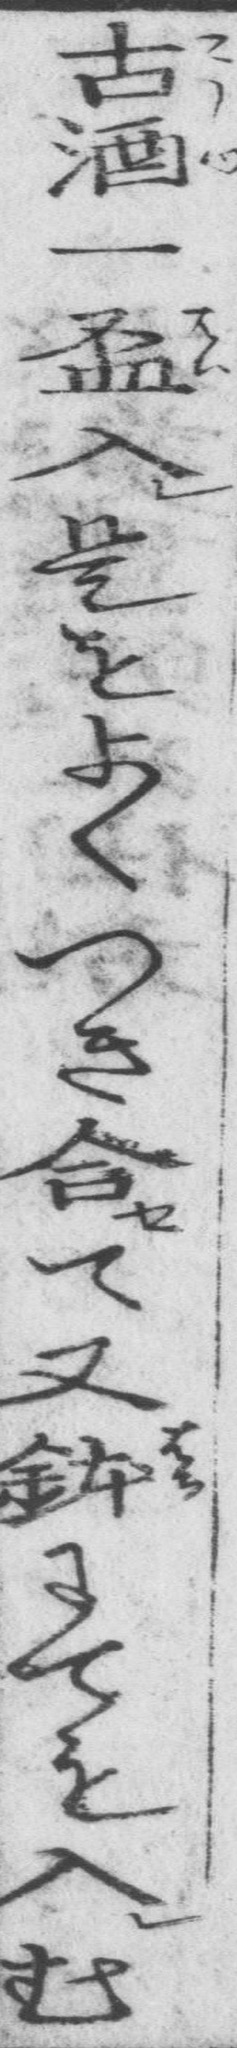古酒一盃入れ是をよくつき合せて又鉢にても入れむ
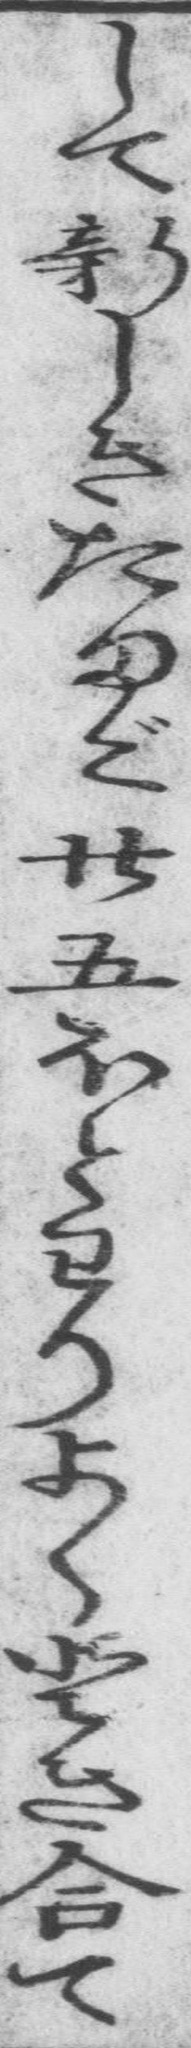して新しきたまご廿五ほとわりよくとき合て
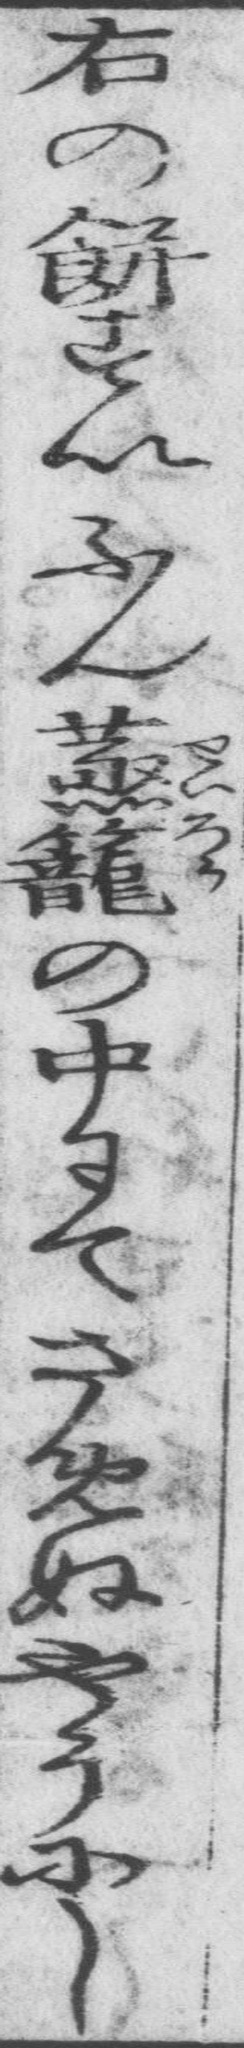右の餅すいふん蒸篭の中にてさめぬやうにし
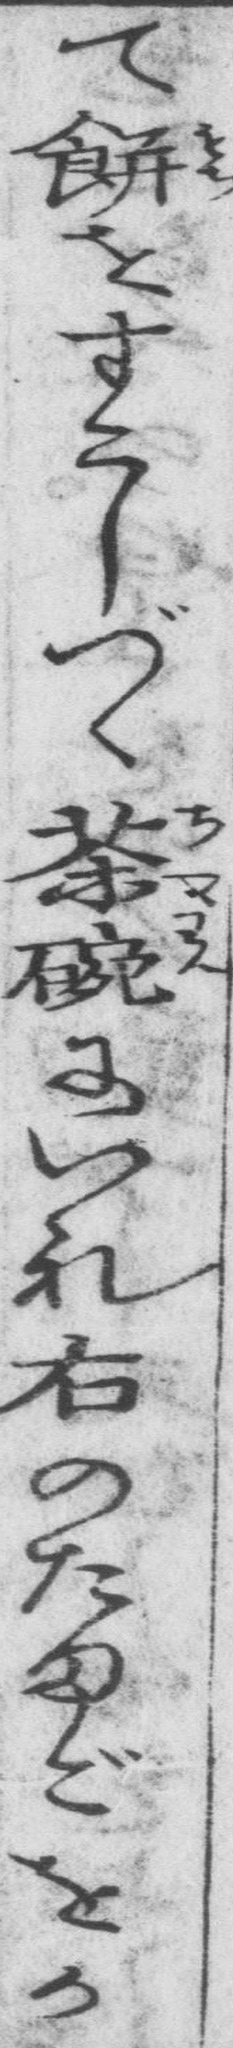て餅をすこしづゝ茶碗にいれ右のたまごをか
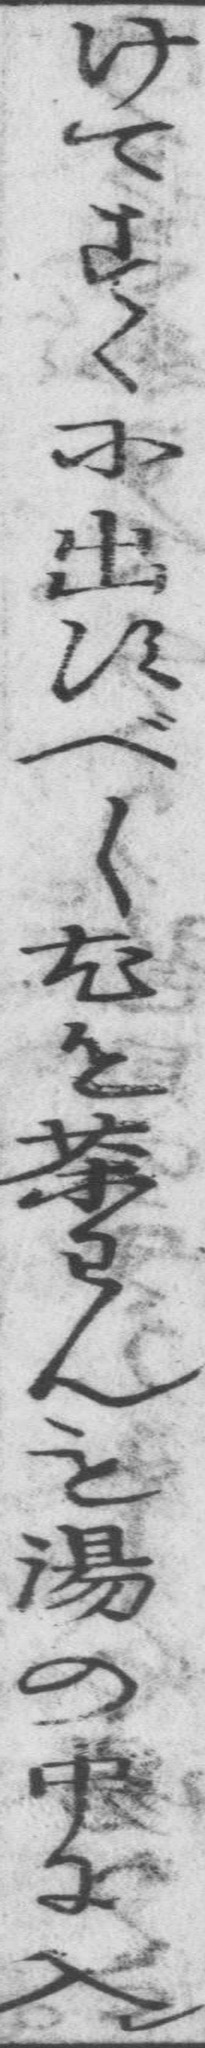けてすくに出すべし尤も茶わんも湯の中に入れ
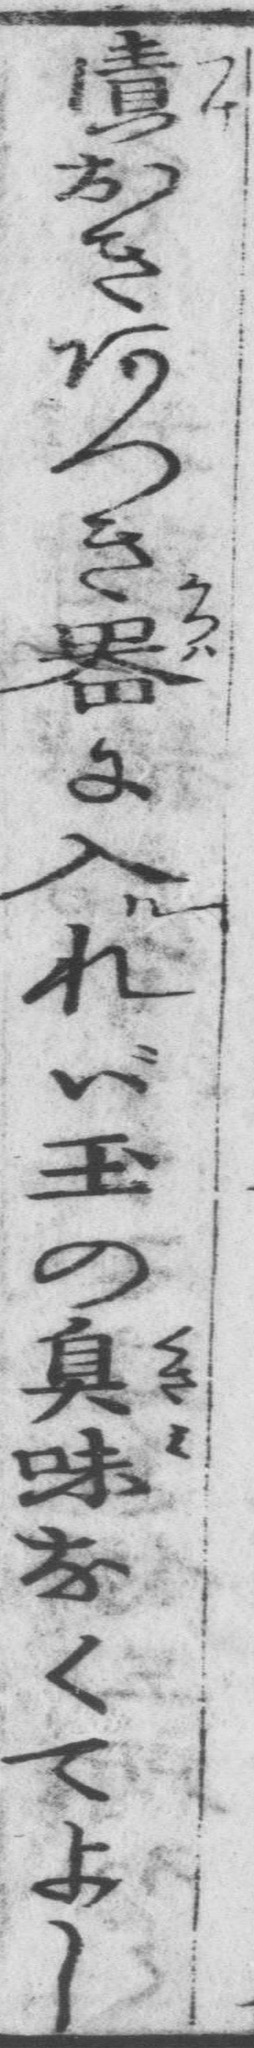漬おきあつき器に入るれば玉の臭味なくてよし
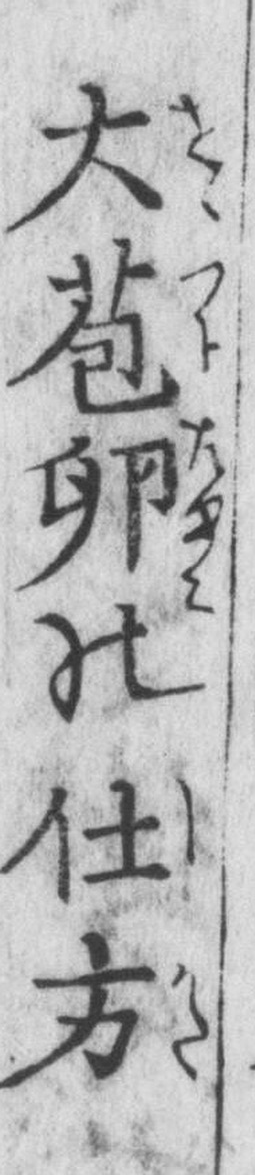大苞卵の仕方
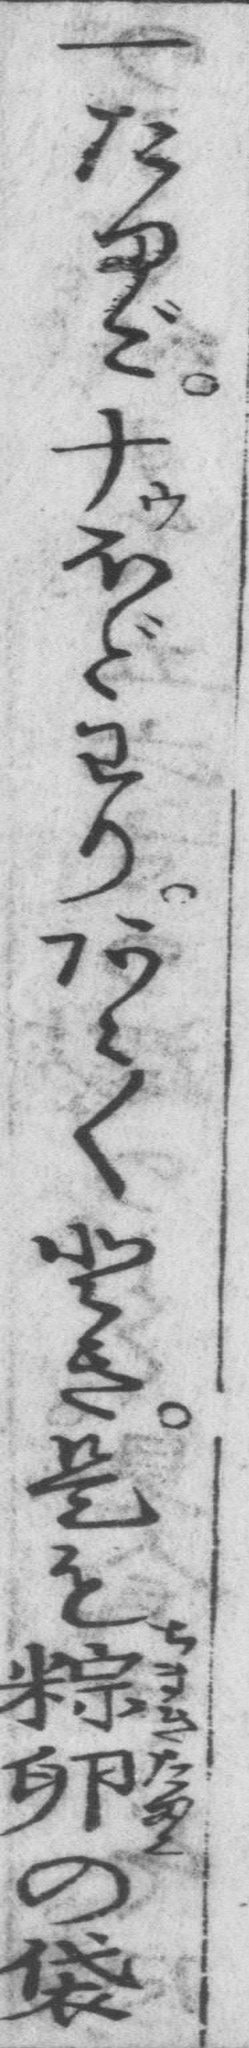一たまご。十ウほどわり。あらくとき。是も粽卵の袋

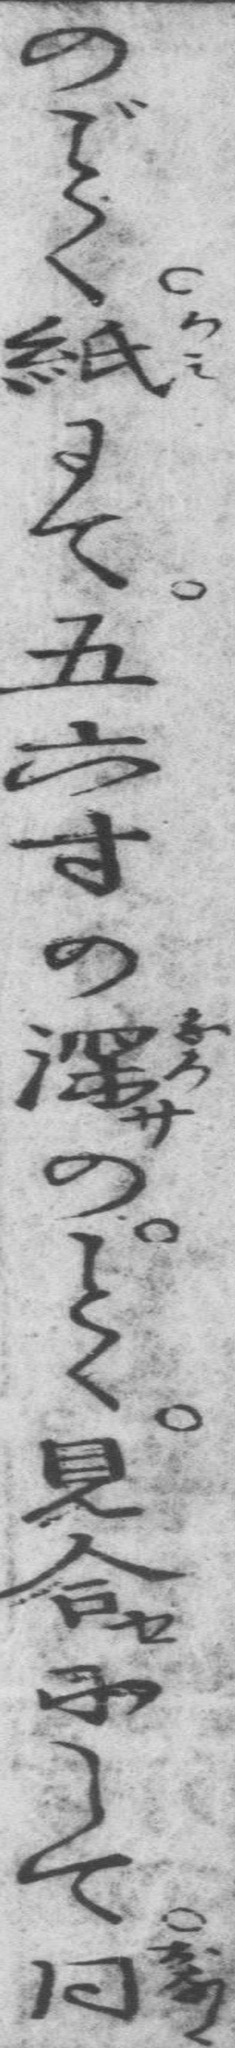のごとく。紙にて。五六寸の深さの。ことく。見合せにして。同
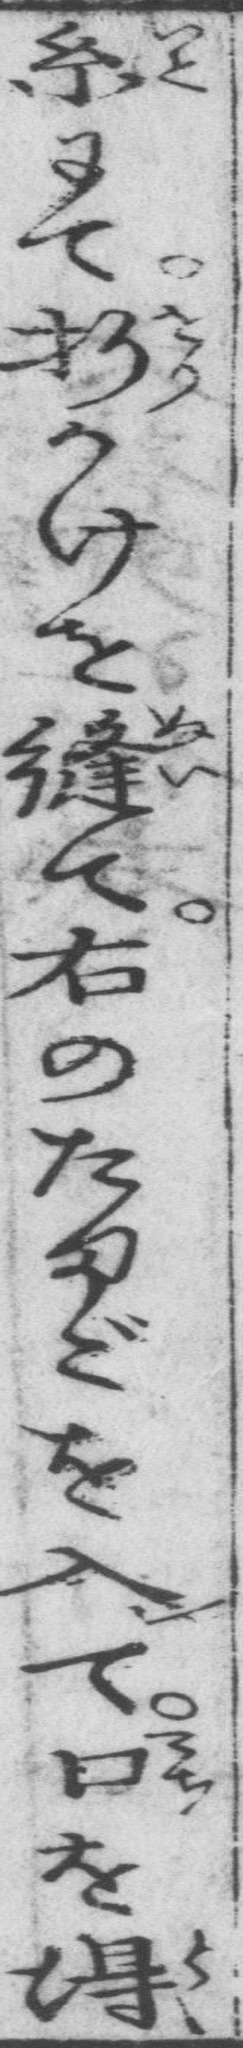糸にて。折かけを縫て。右のたまごを入れて。口を得
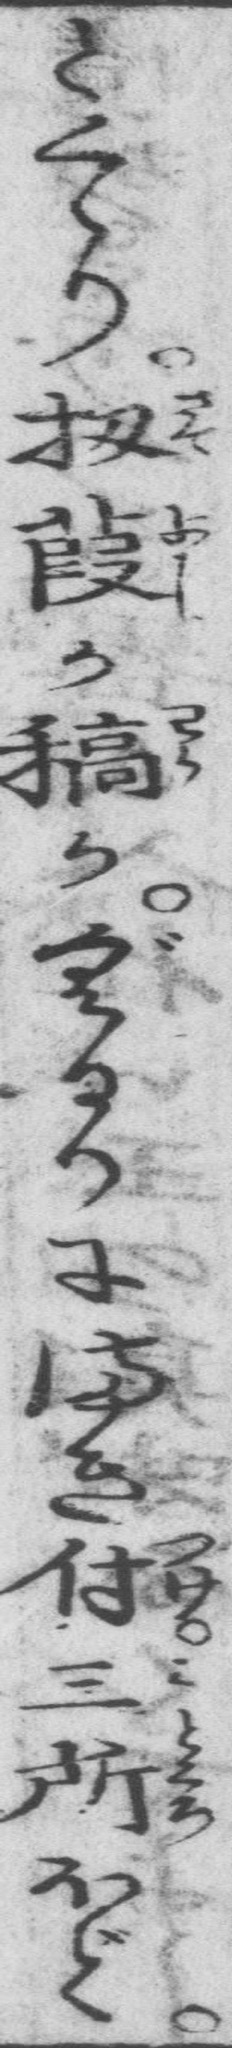とくゝり。扨葭か稿か。ぐなりにまき付。三所ほど。
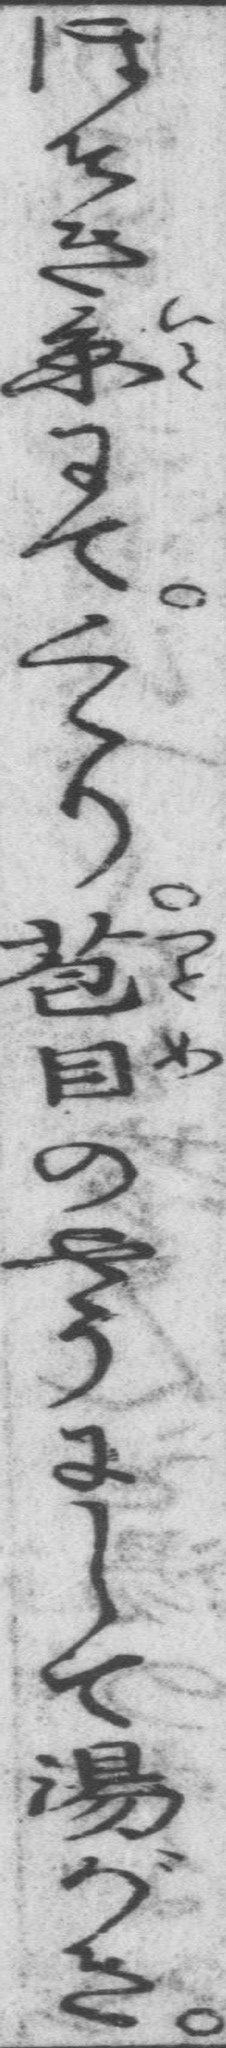ほそき糸にて。くゝり。苞目のやうにして湯がき。
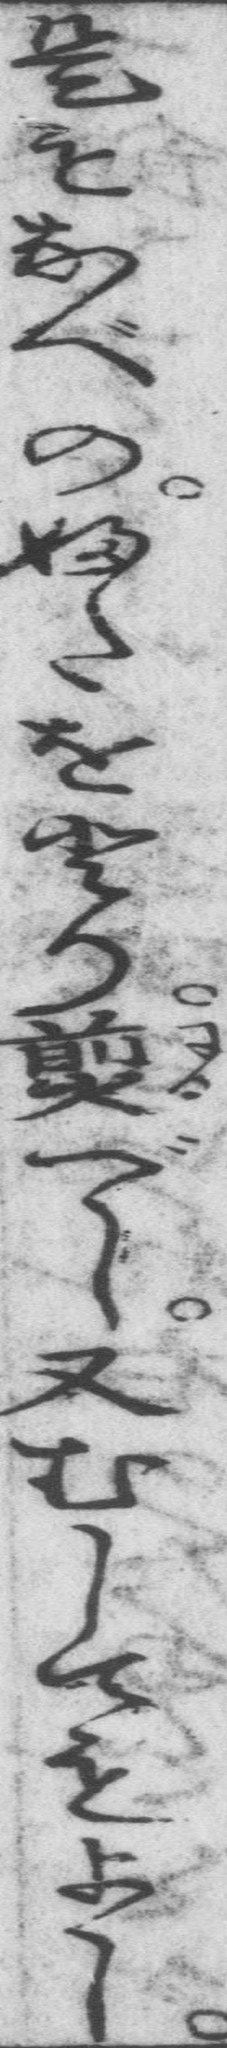是もなべの。ふたをとり。煎べし。又むしてもよし。
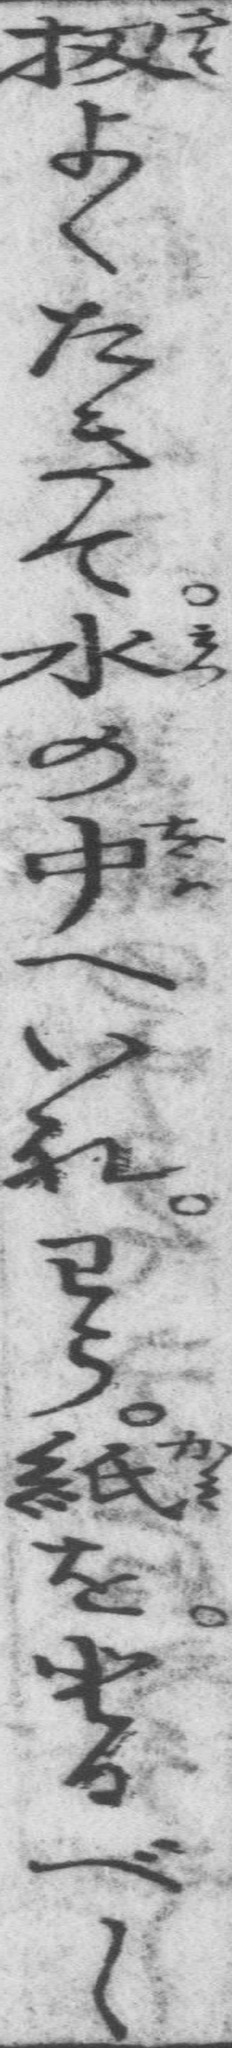扨よくたきて。水の中へいれ。わら。紙を。とるべし
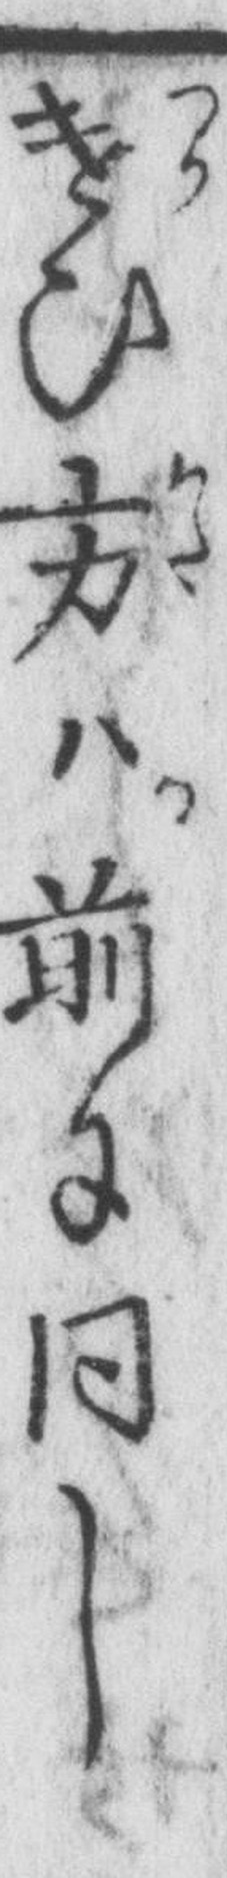遣ひ方は。前に同し
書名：萬寳料理秘密箱
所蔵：大阪府立大学学術情報センター 国文学研究資料館
